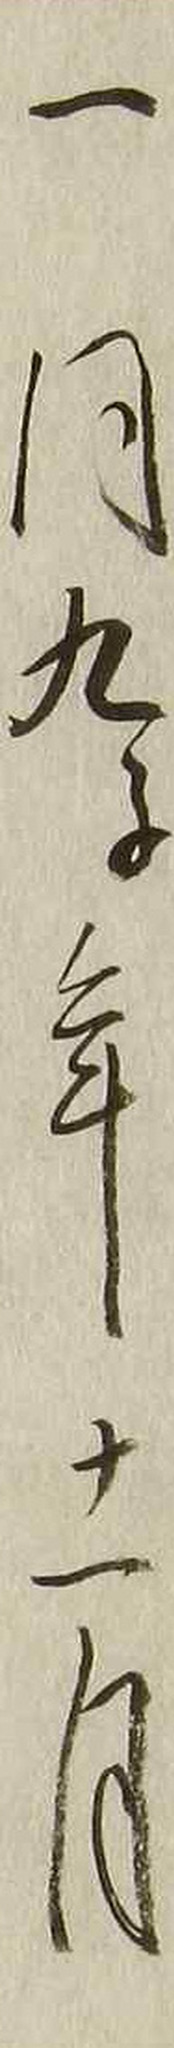一同九子年十一月
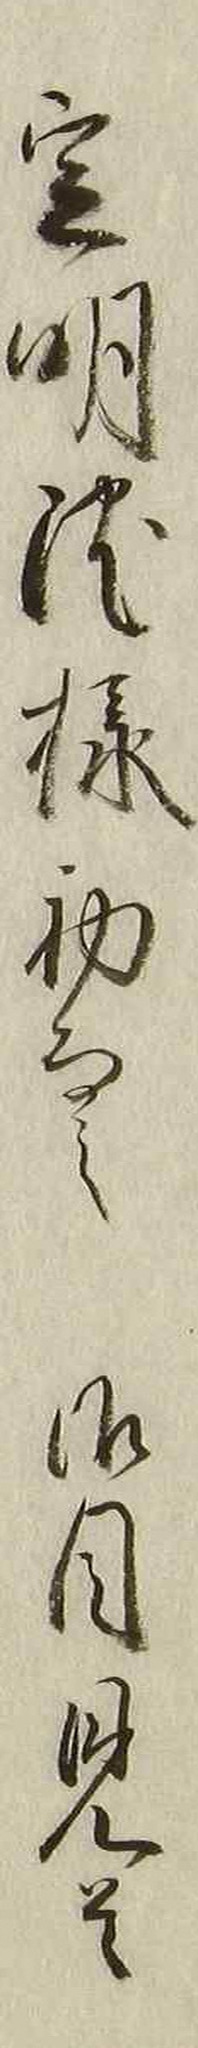定明院様初而之御目見首
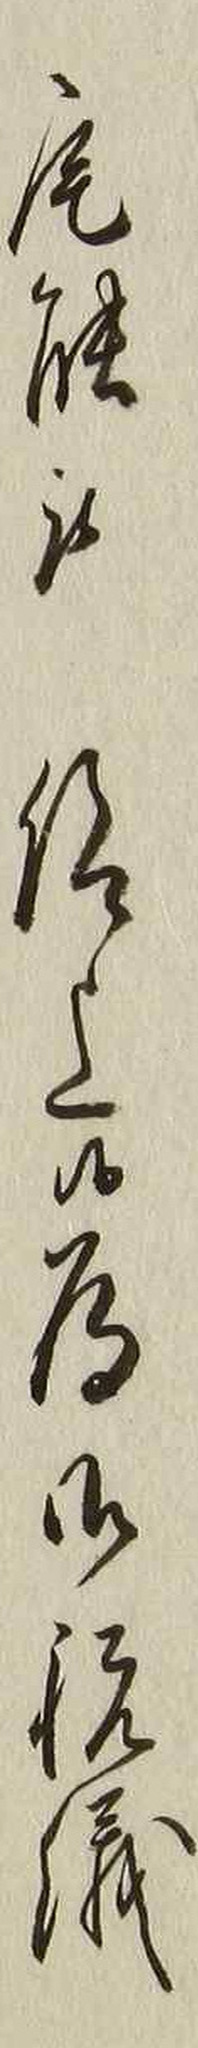尾能被仰上候為御祝儀
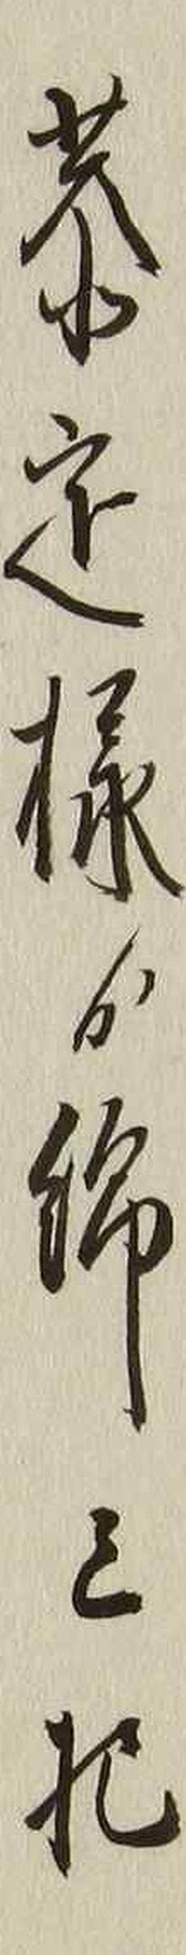恭定様ゟ綿三把
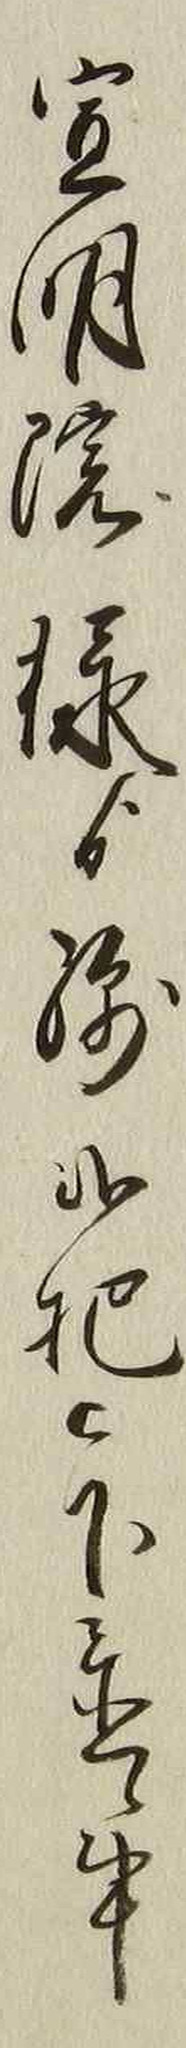宣明院様ゟ綿弐把被下置候事
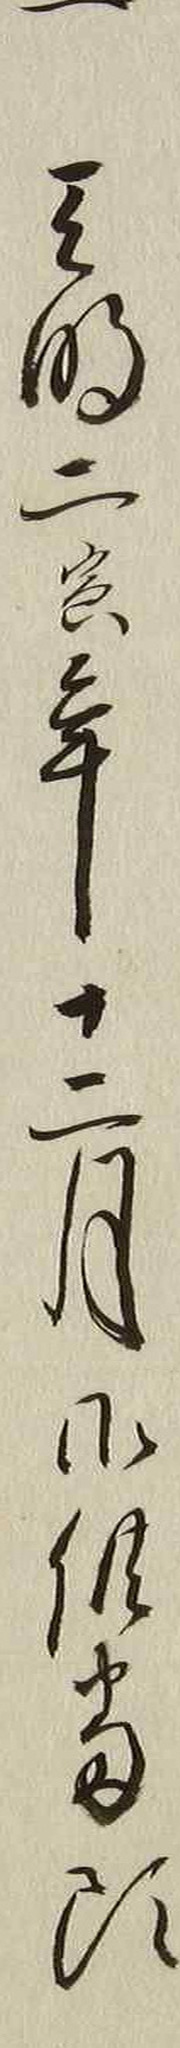一天明二寅年十二月御供番頭
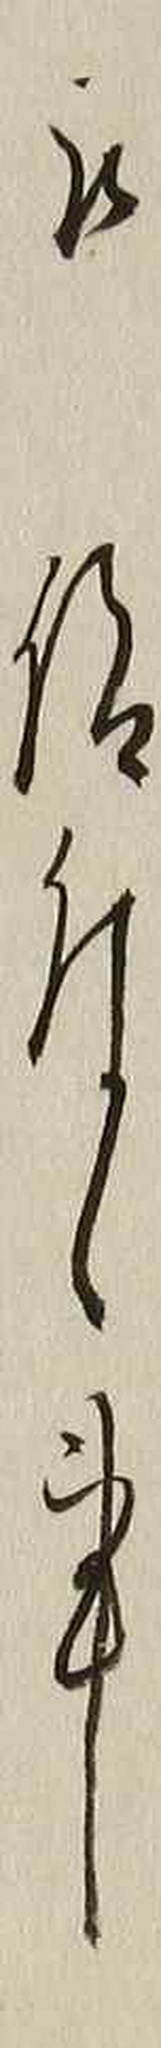被仰付候事
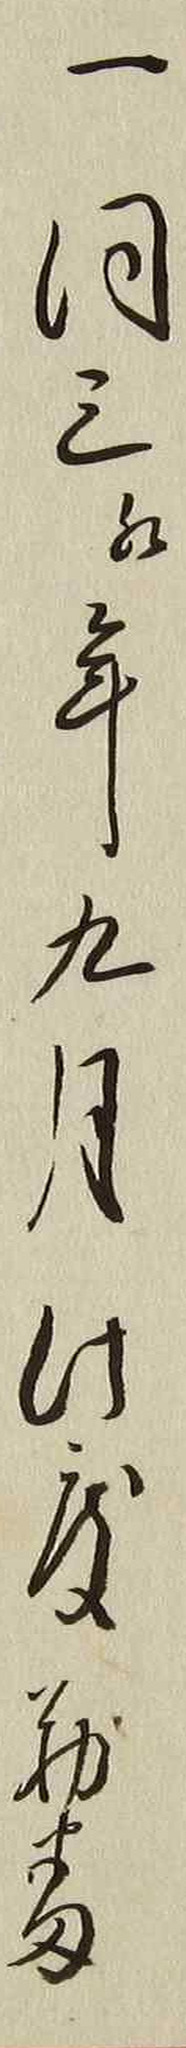一同三卯年九月此度勤番
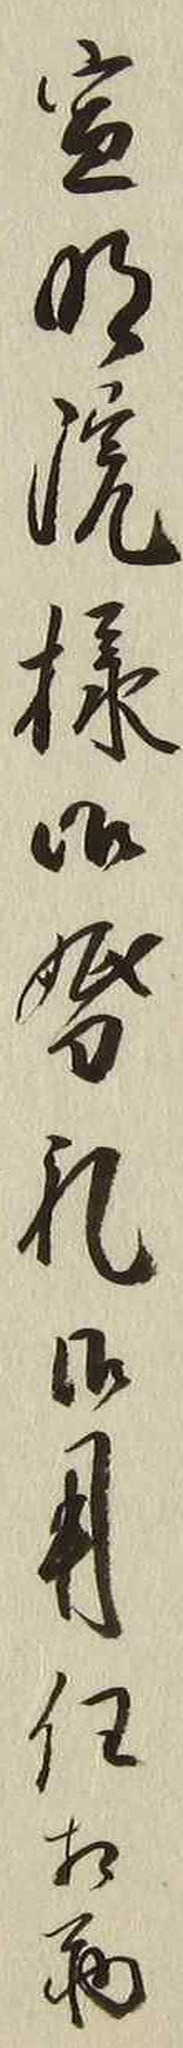宣明院様御婚礼御用任相勤
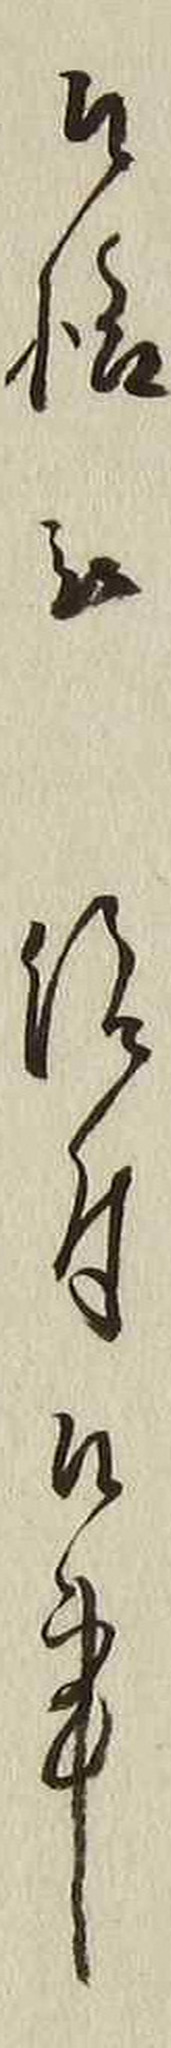候様被仰付候事
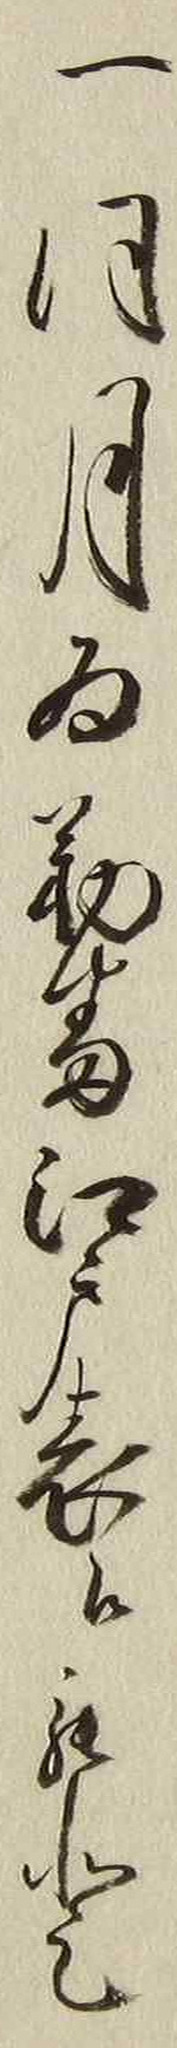一同月為勤番江戸表江罷登
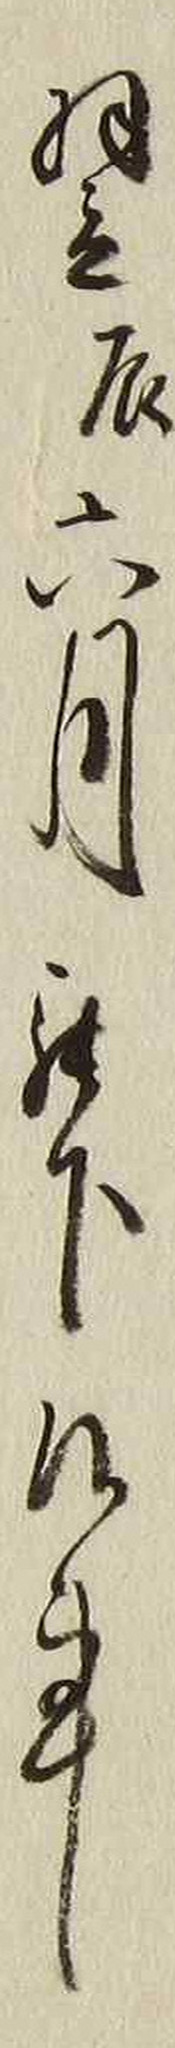翌辰六月罷下候事
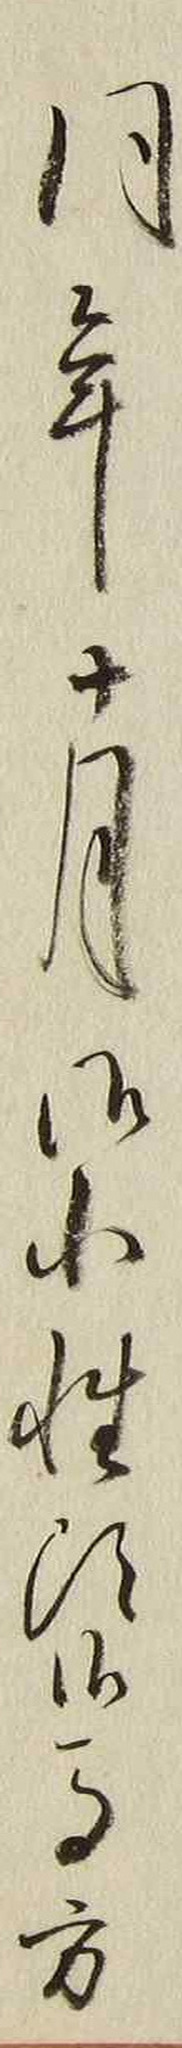一同年十月御小性頭御馬方
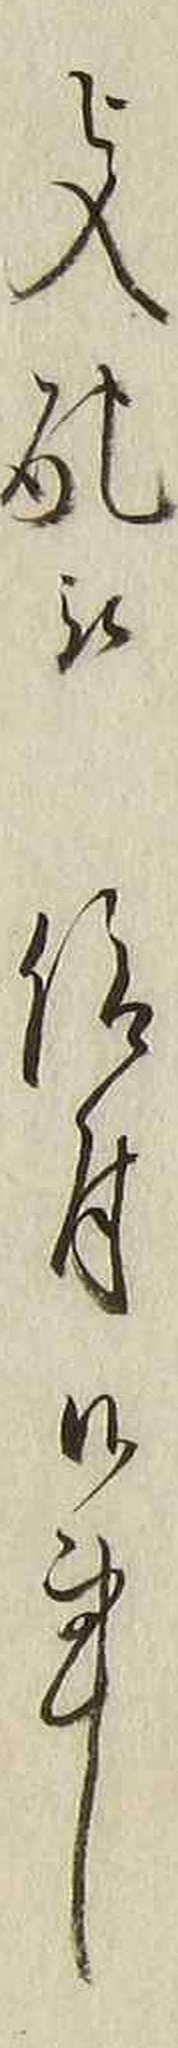支配被仰付候事
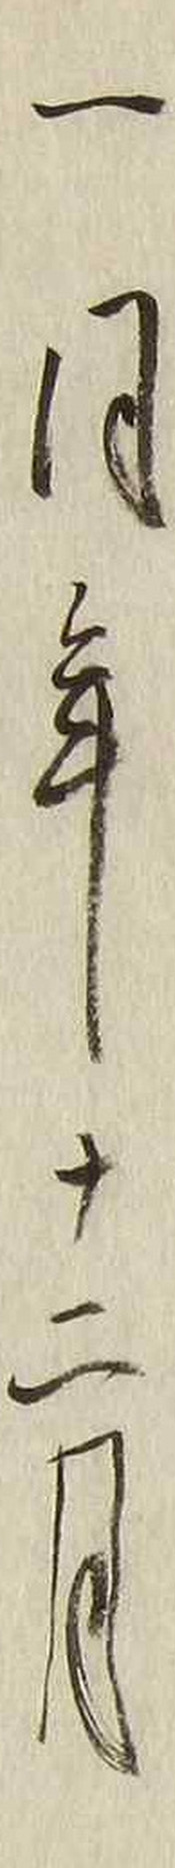一同年十二月

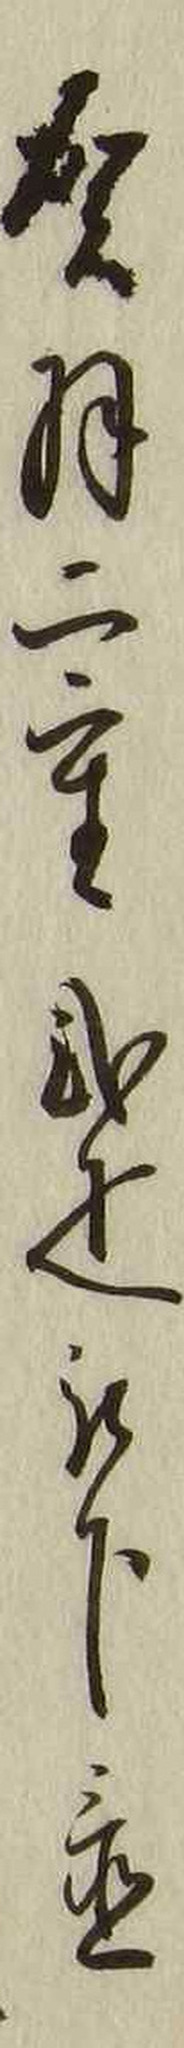賀羽二重弐疋被下置
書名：諸士系譜　巻之18　い之部18
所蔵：会津若松市立会津図書館
